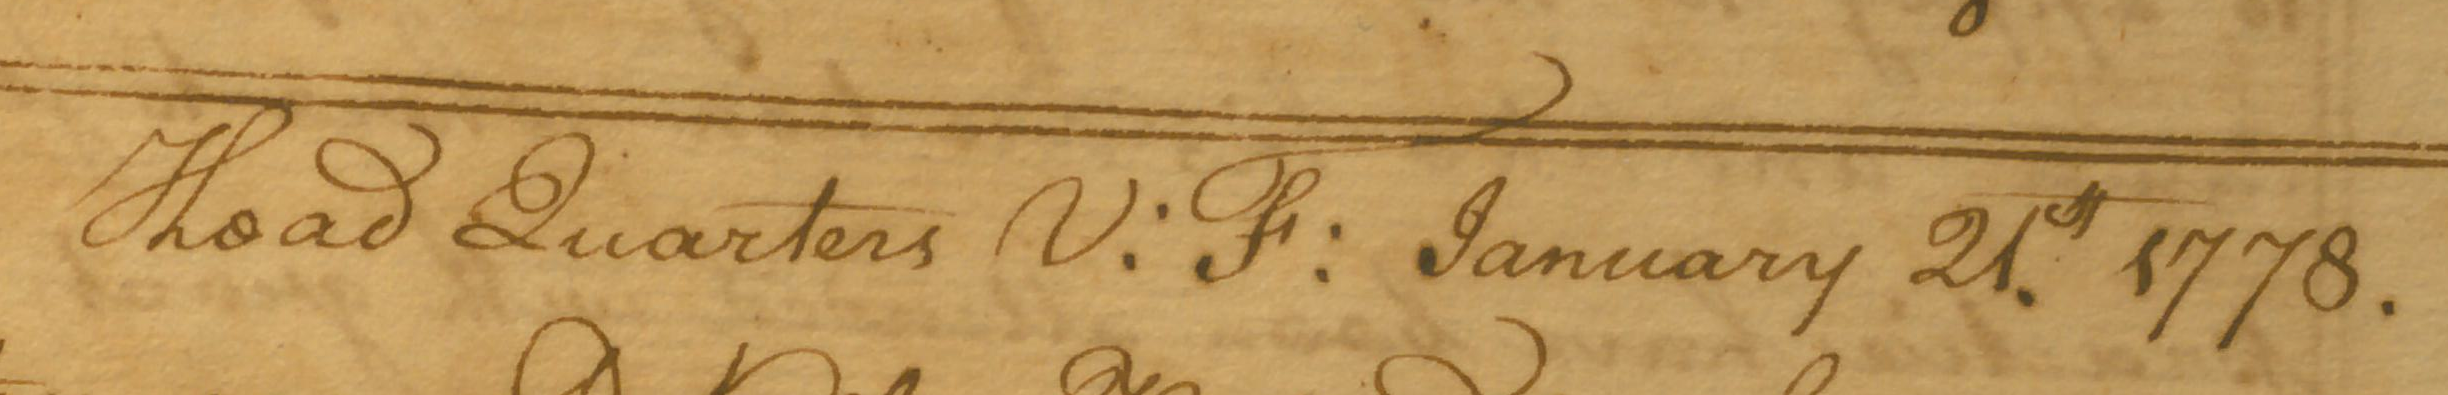Head Quarters V: F: January 21^st. 1778.
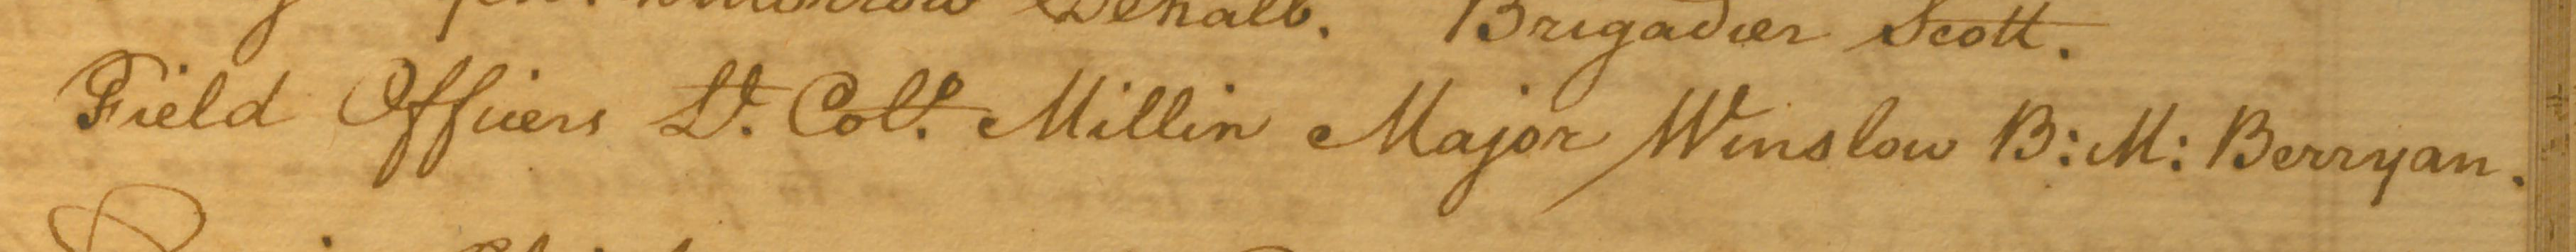Field Officers L^t. Col^o. Millin Major Winslow B: M: Berryan.
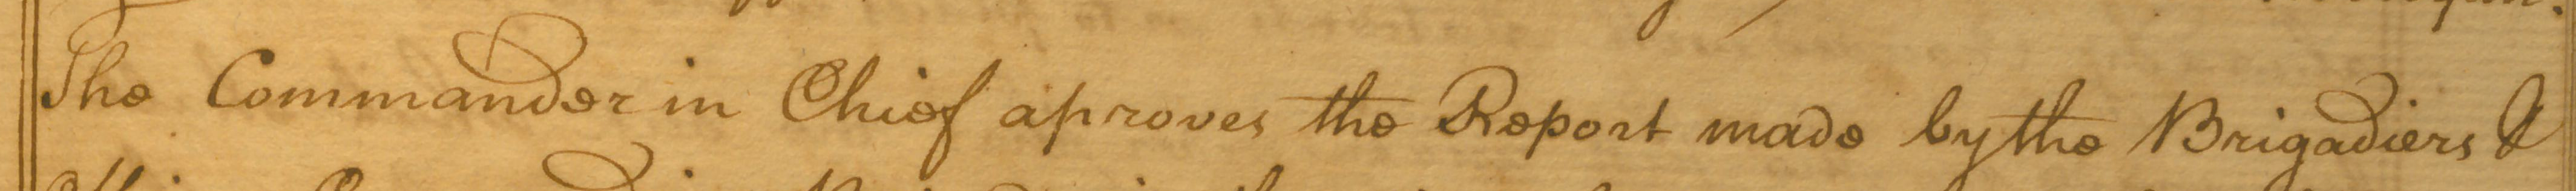The Commander in Chief aproves the Report made by the Brigadiers &
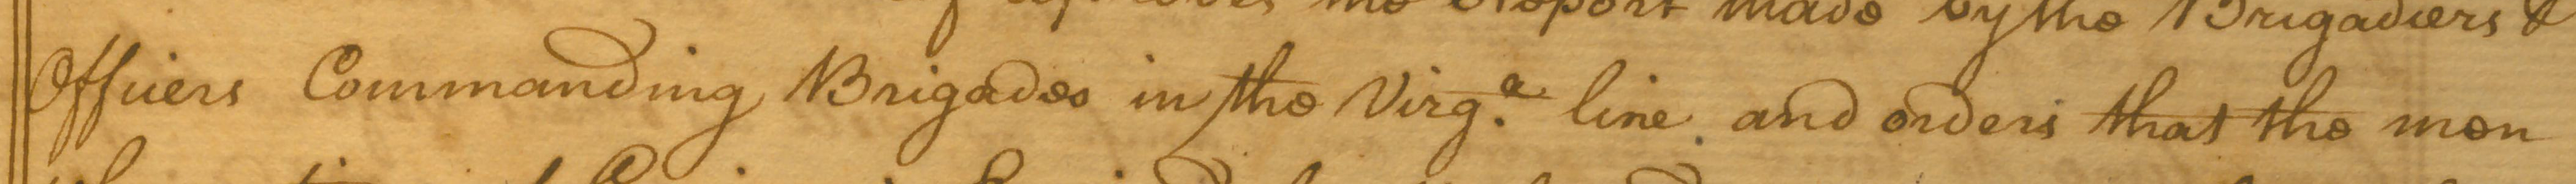Officers Commanding Brigades in the Virg^a. line and orders that the men
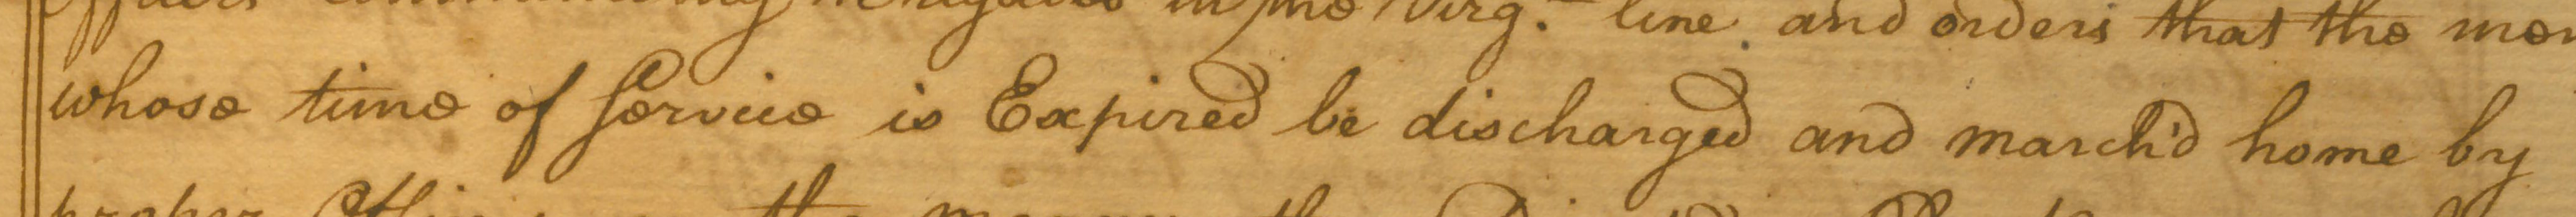whose time of service is Expired by discharged and march'd home by
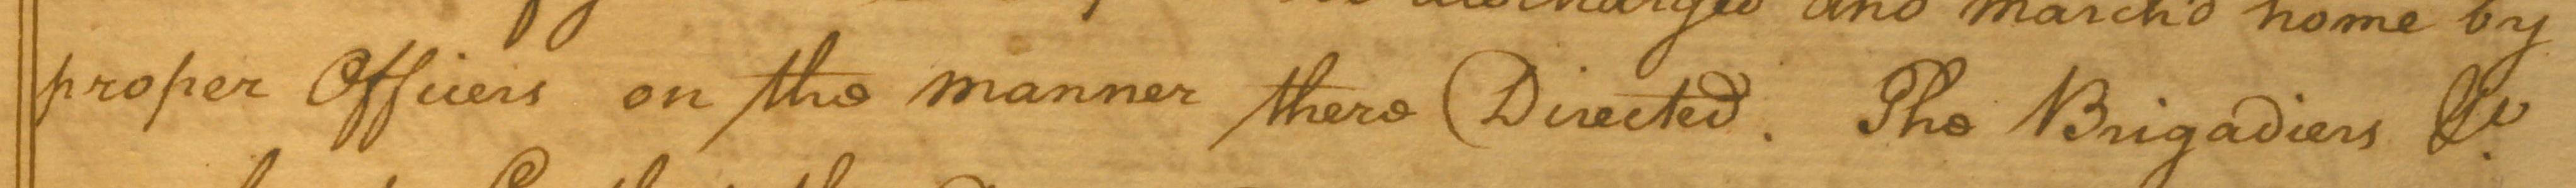proper Officers on the manner there Directed. The Brigadiers &c.
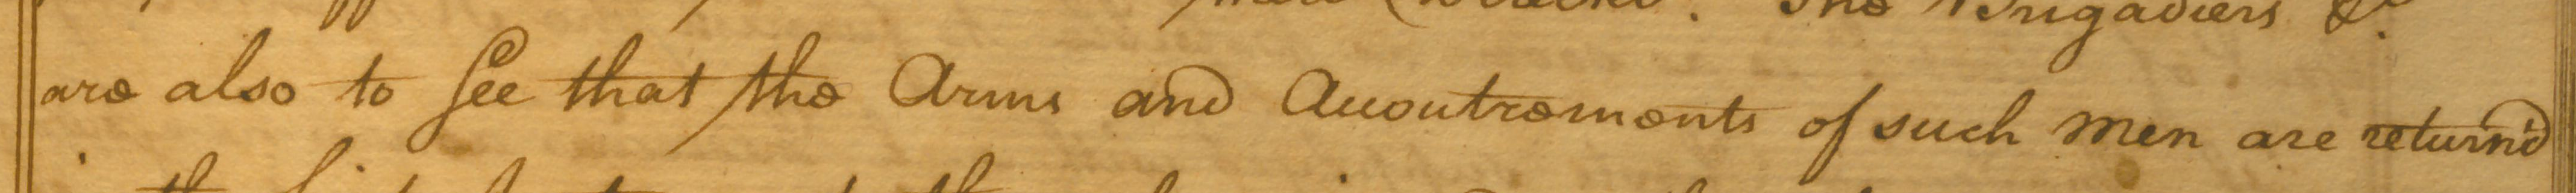are also to see that the Arms and Accoutrements of such men are return'd
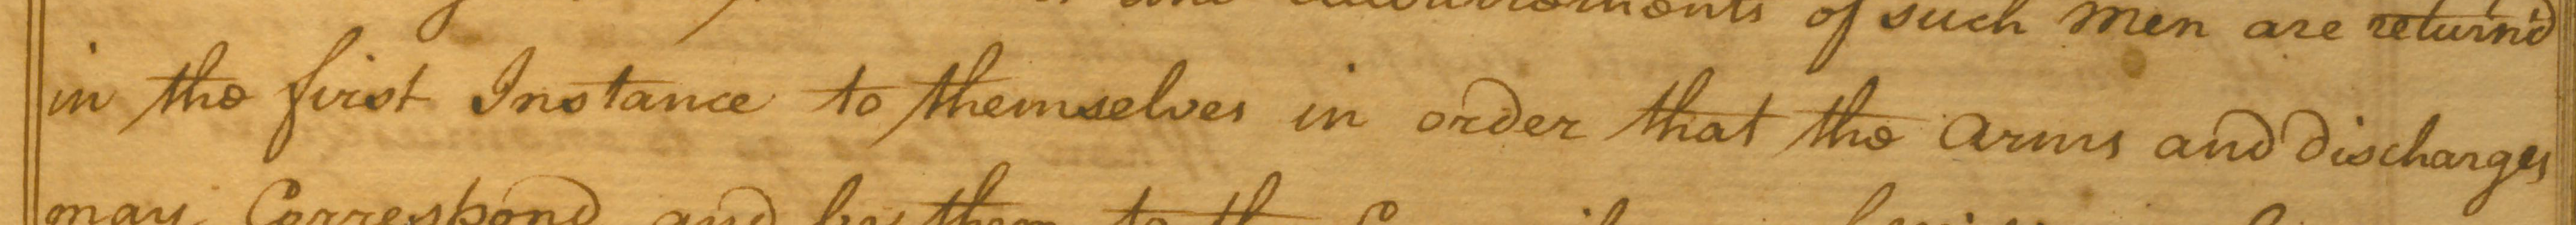in the first Instance to themselves in order that the arms and discharges
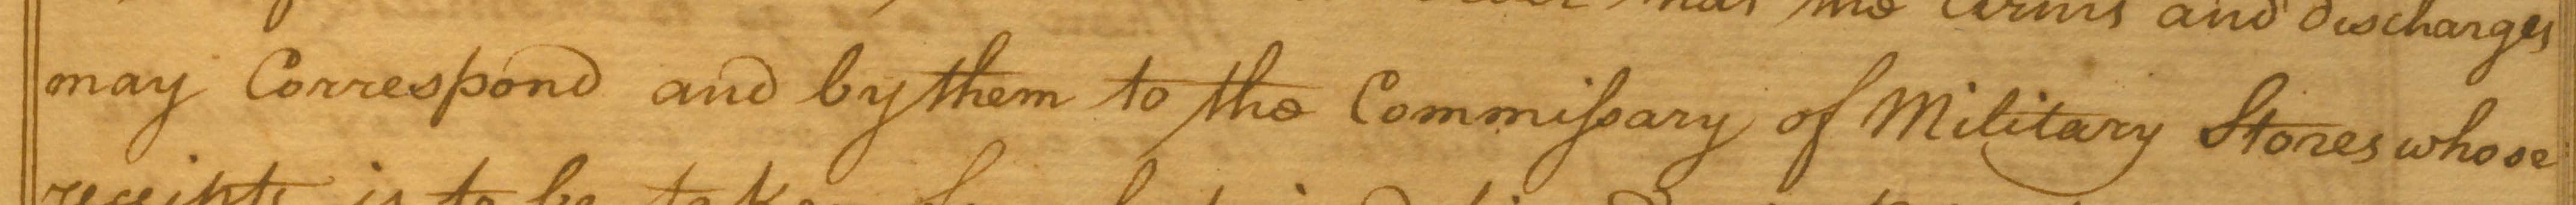may Correspond and by them to the Commissary of Military Stores whose
